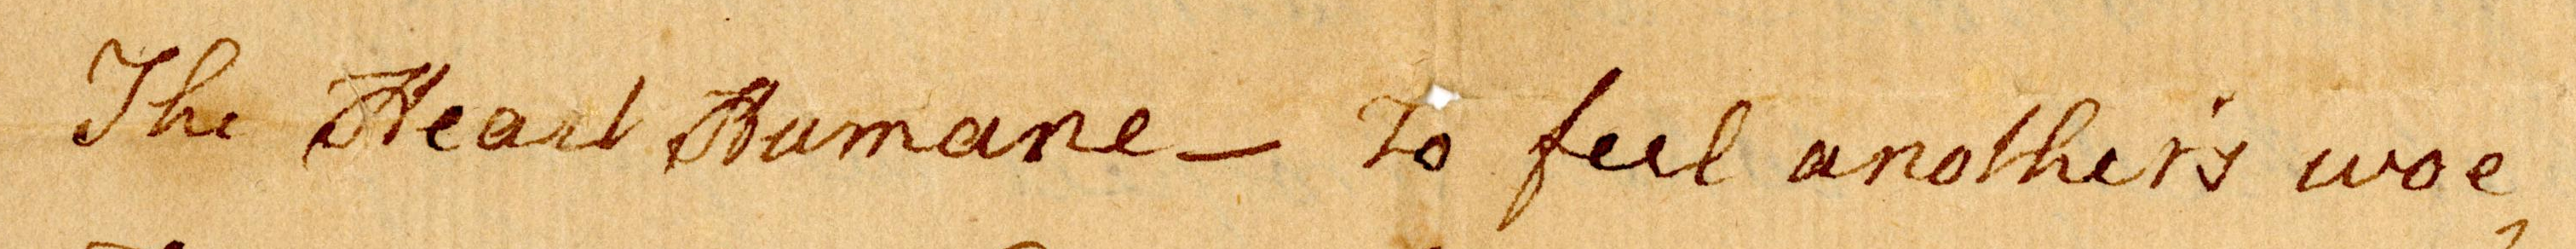The Heart Humane- to feel another's woe,
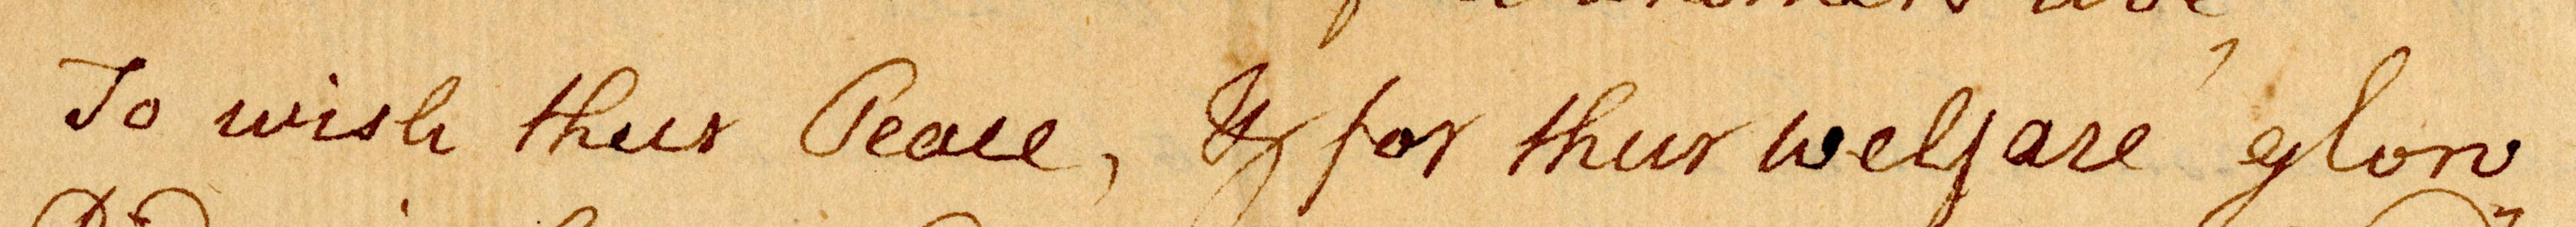To wish their Peace, & for their welfare glow
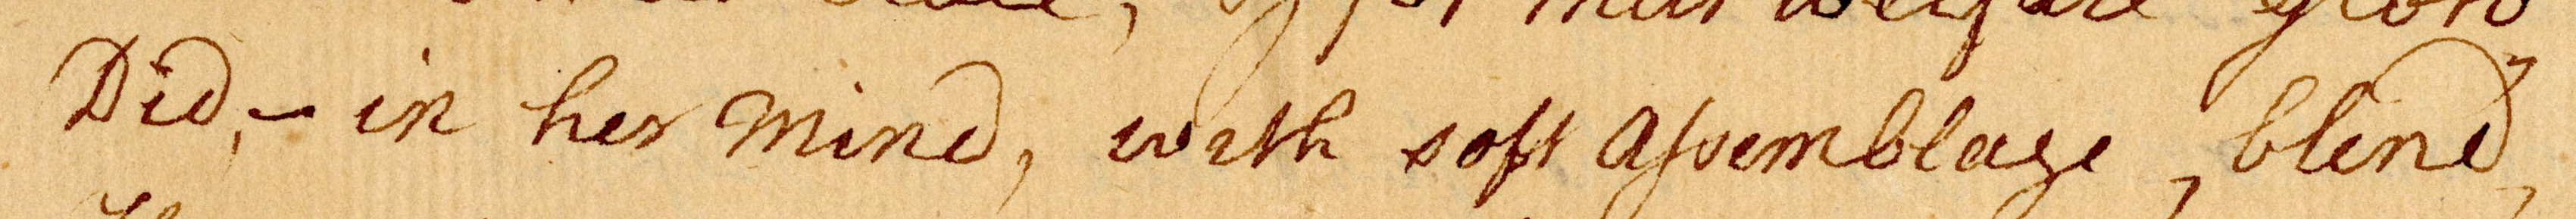Did,- in her mind, with soft assemblage, blind,
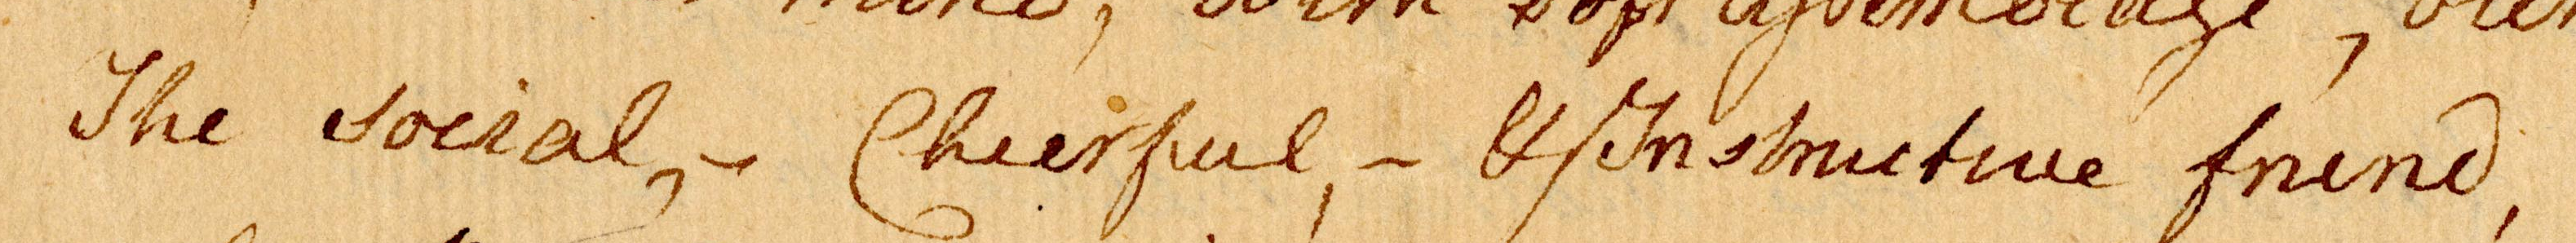The social,- Cheerful,- & Instructive friend,
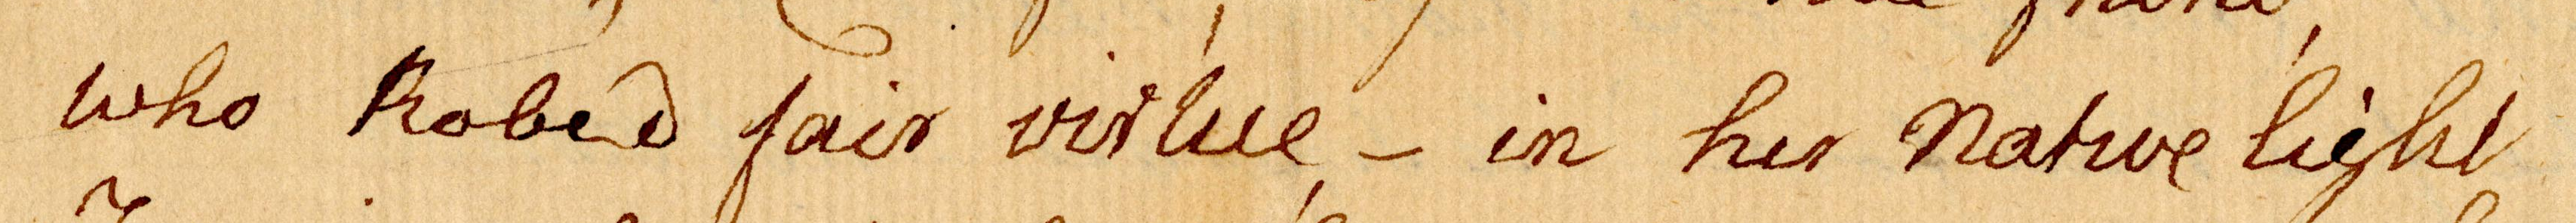Who Robed fair virtue,- in her Native light
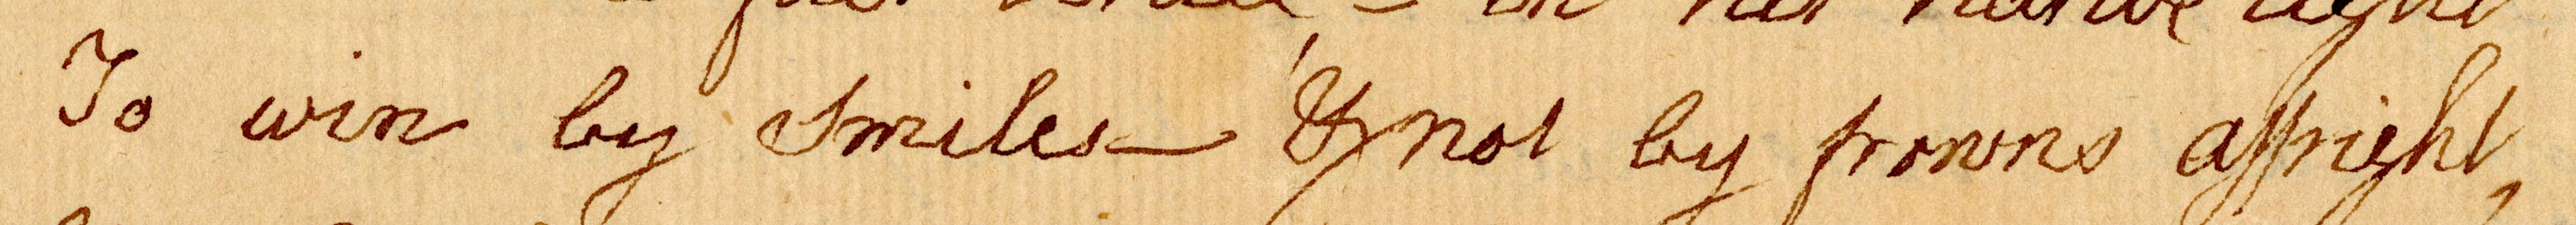To win by Smiles- & not by frowns affright,
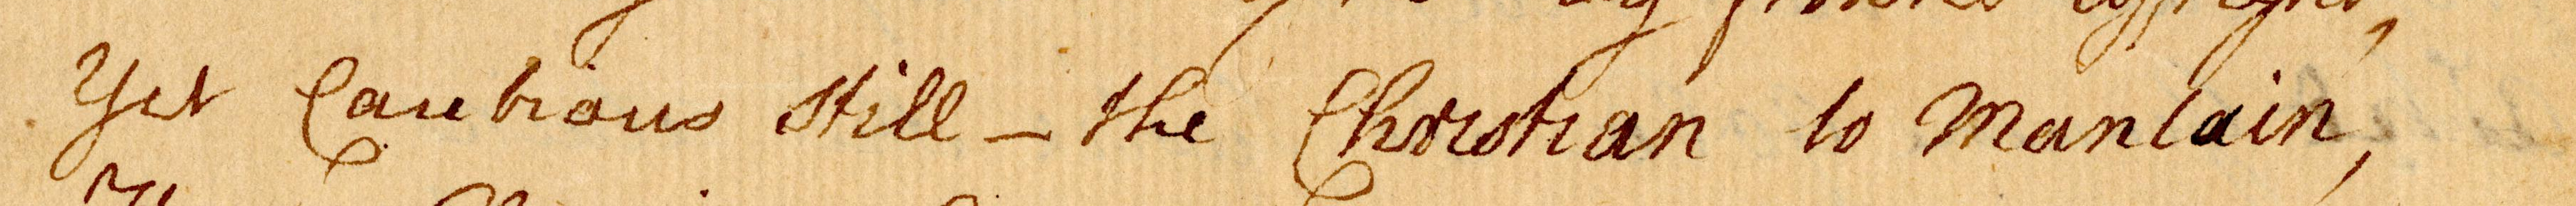Yet Cautious still- the Christian to Mantain,
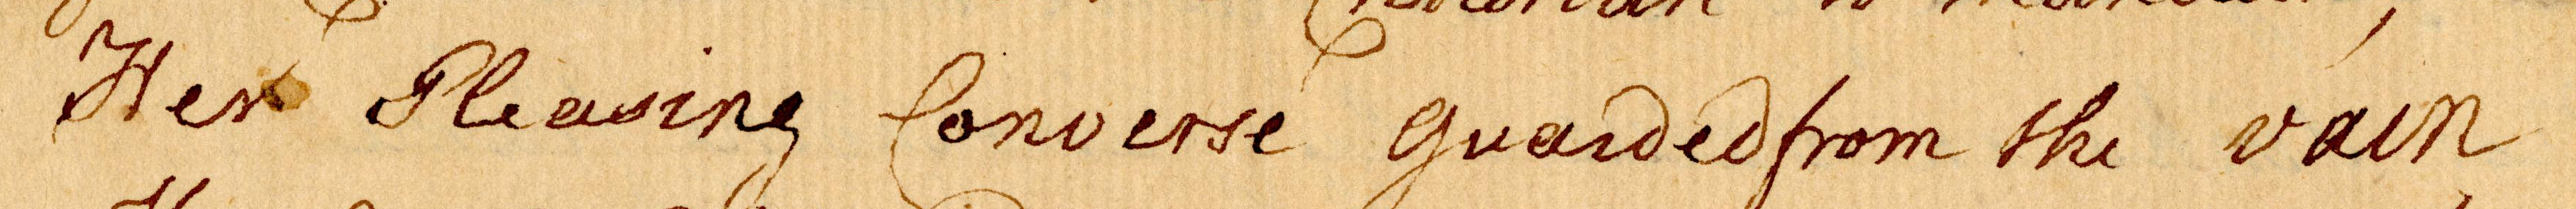Her Pleasing Converse guarded from the vain,
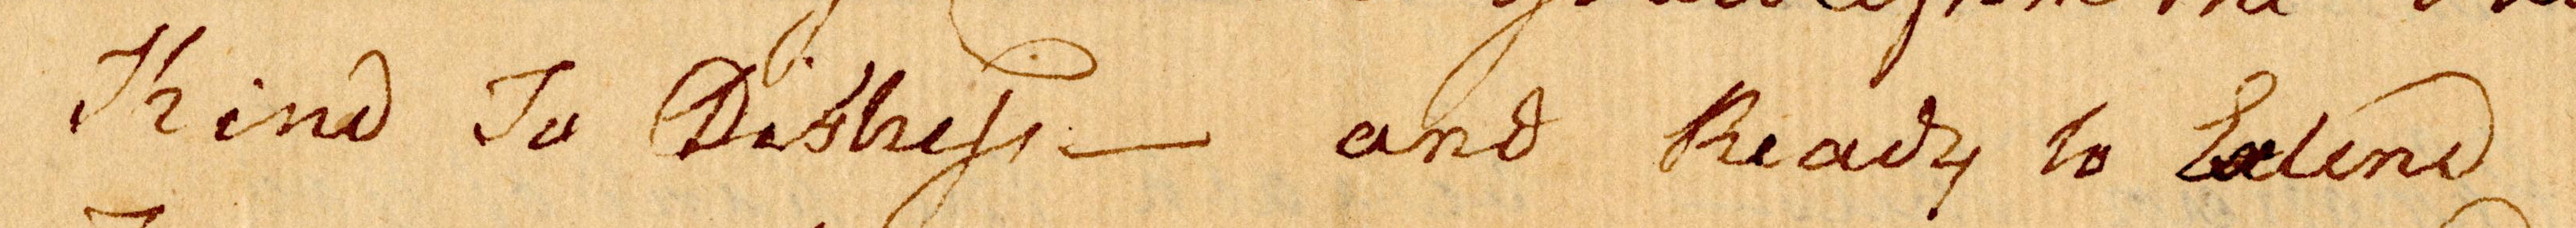Kind To Distress- and Ready to Extend
